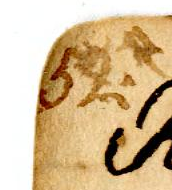52
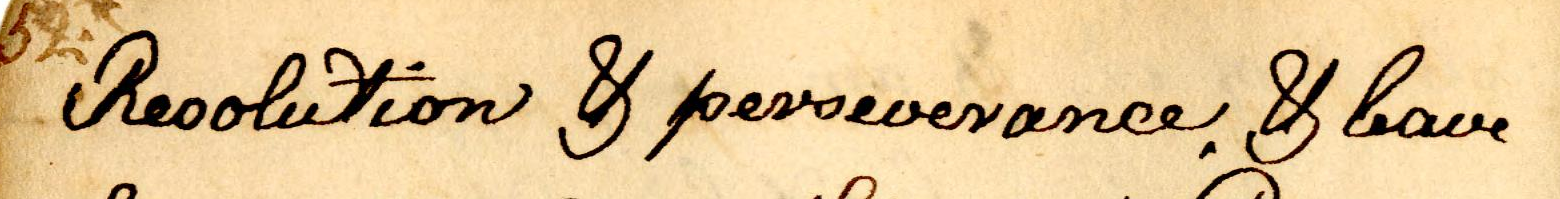Resolution & perseverance, & leave
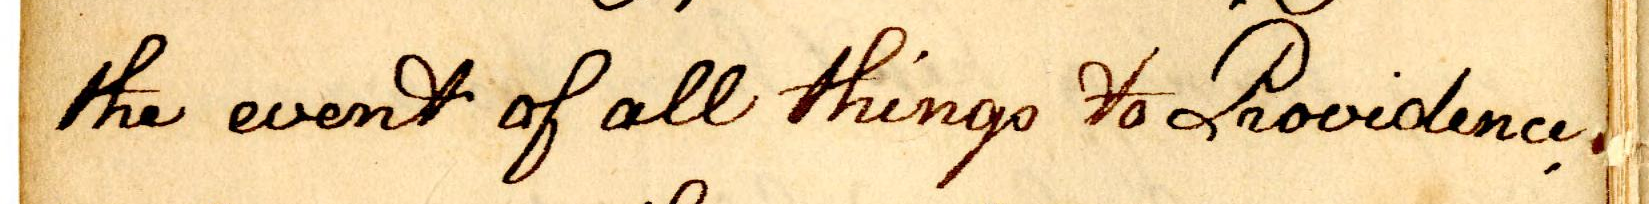the event of all things to Providence
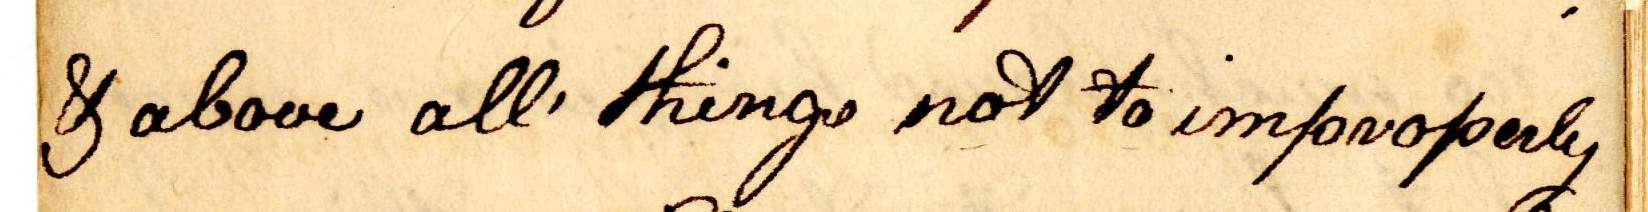& above all things not to improperly
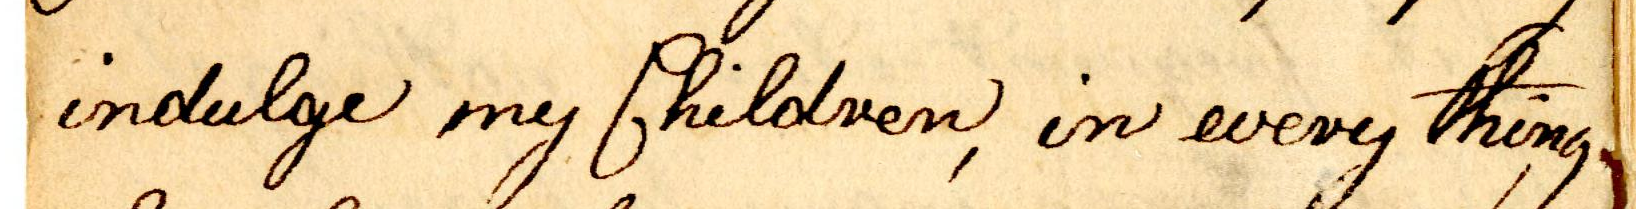indulge my Children, in every thing
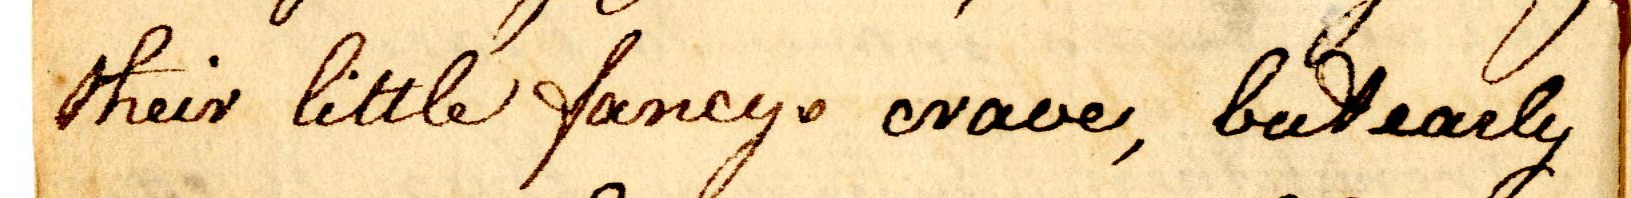their little fancys crave, but early
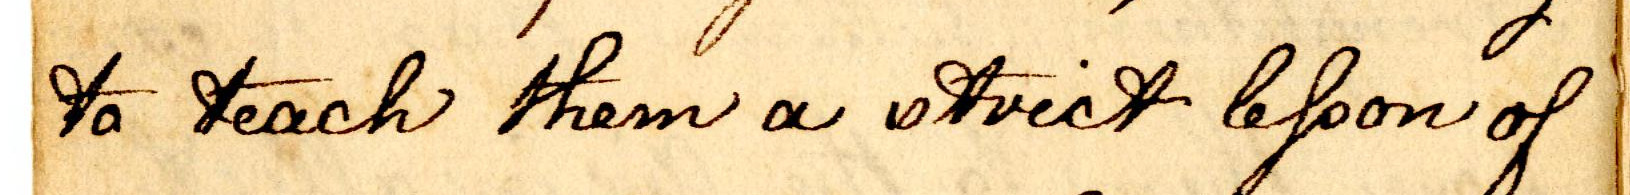to teach them a strict lesson of
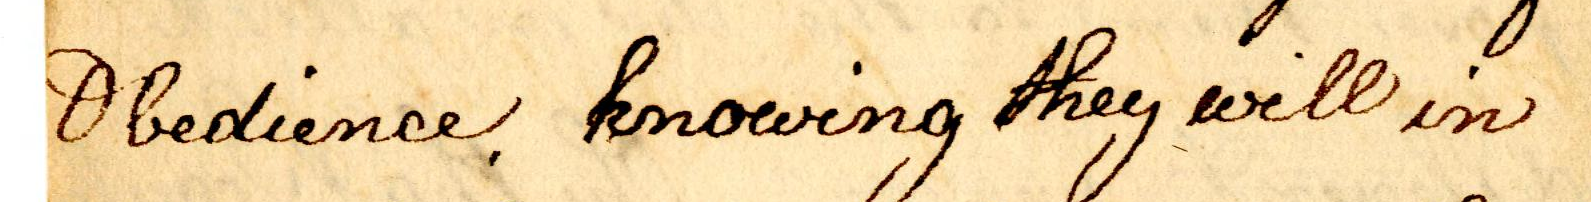Obedience, knowing they will in
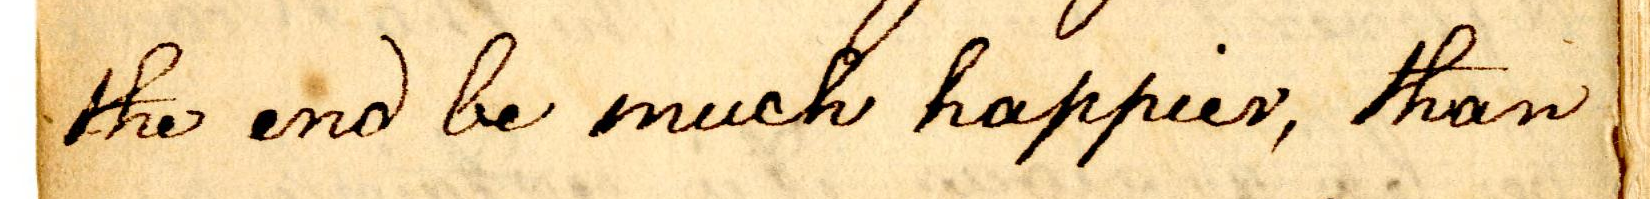the end be much happier, than
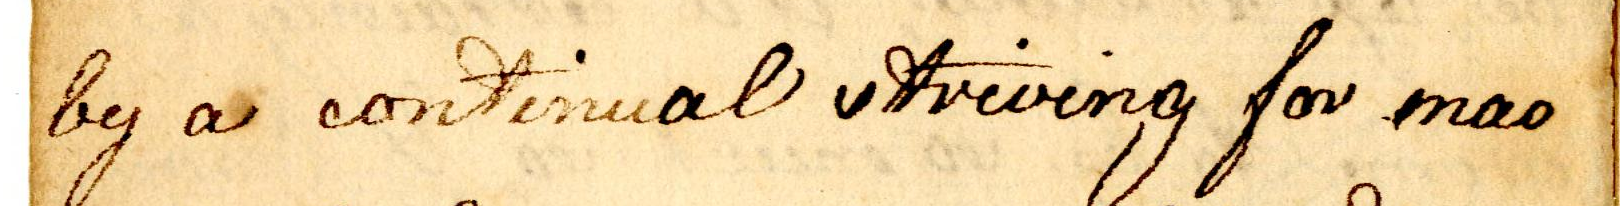by a continual striving for mas
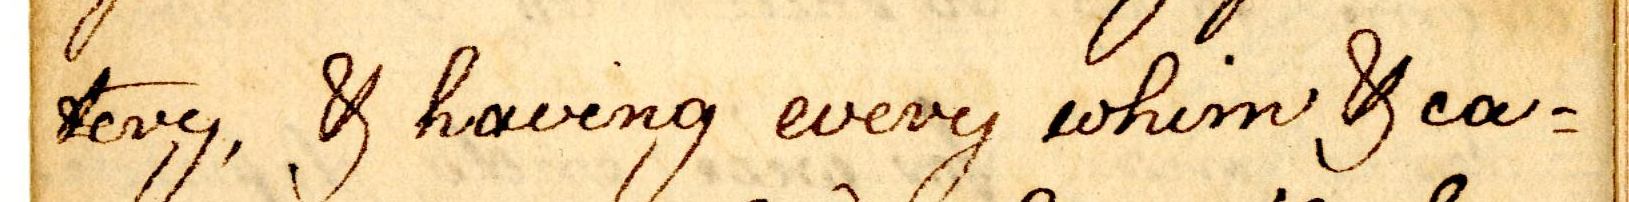tery, & having every whim & ca-
